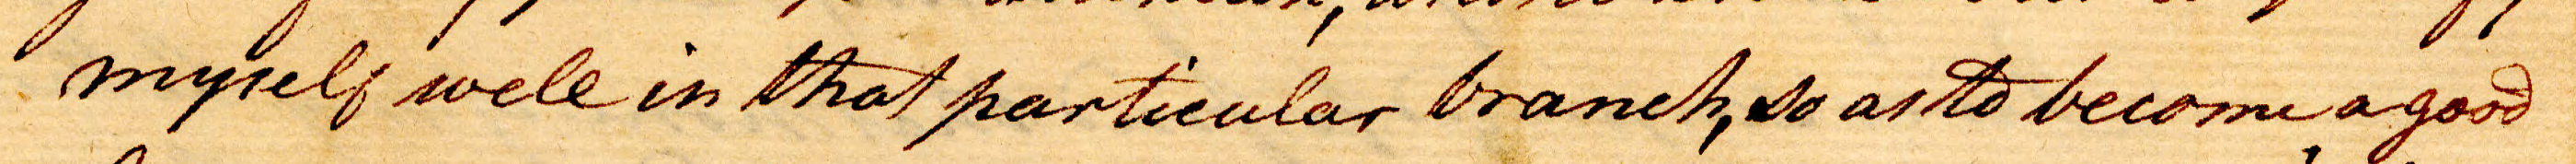myself well in that particular branch, so as to become a good
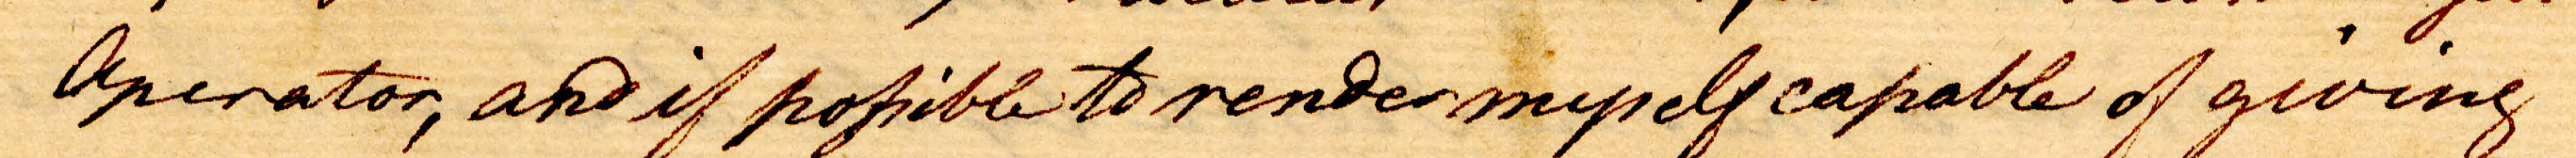Operator, and if possible to render myself capable of giving
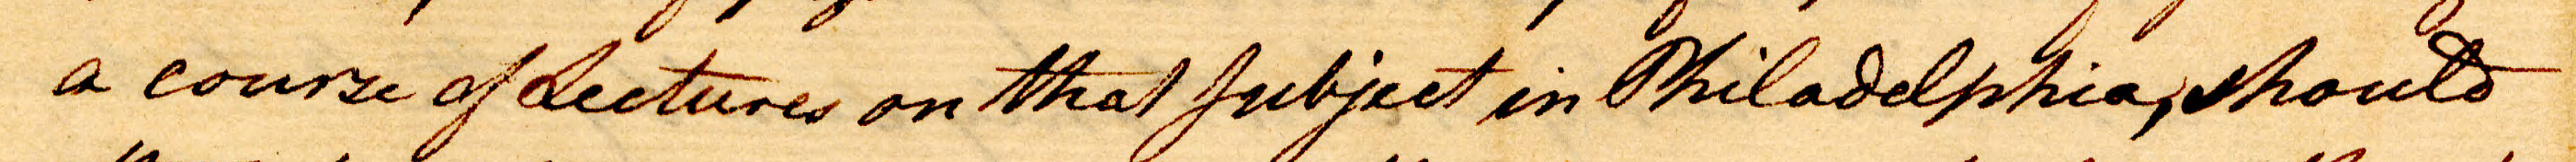a course of Lectures on that Subject in Philadelphia, should
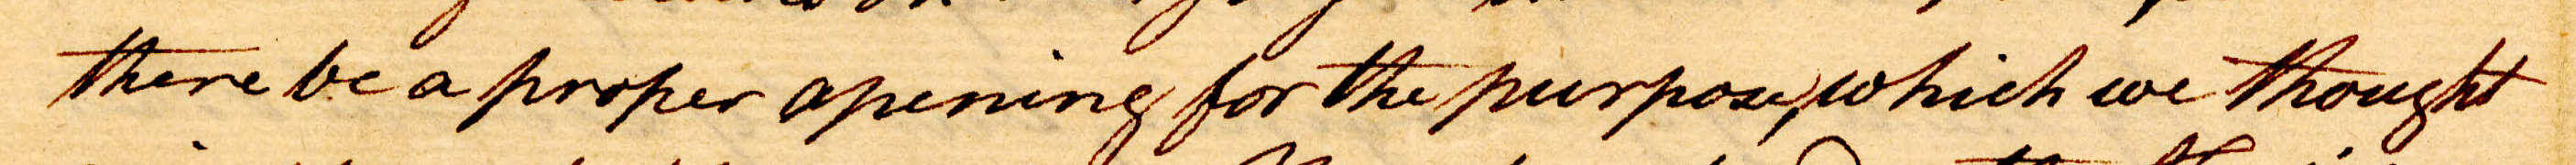there be a proper opening for the purpose, which we thought
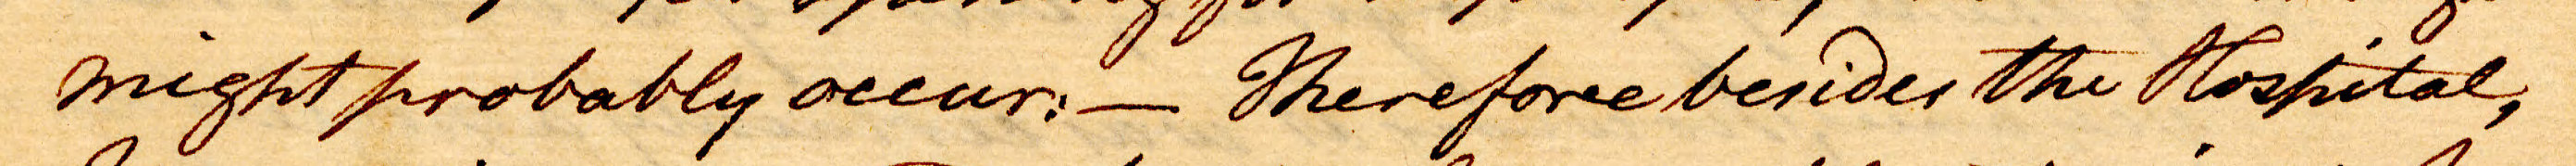might probably occur:- Therefore besides the Hospital,
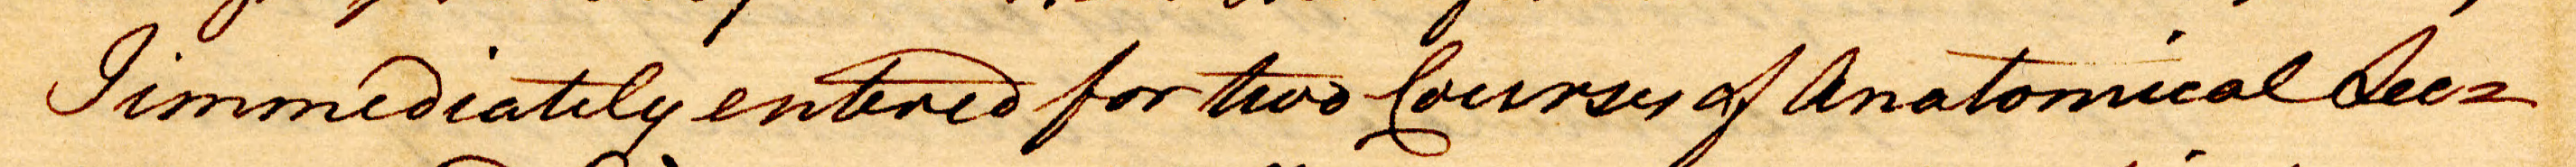I immediately entered for two Courses of Anatomical Lec-
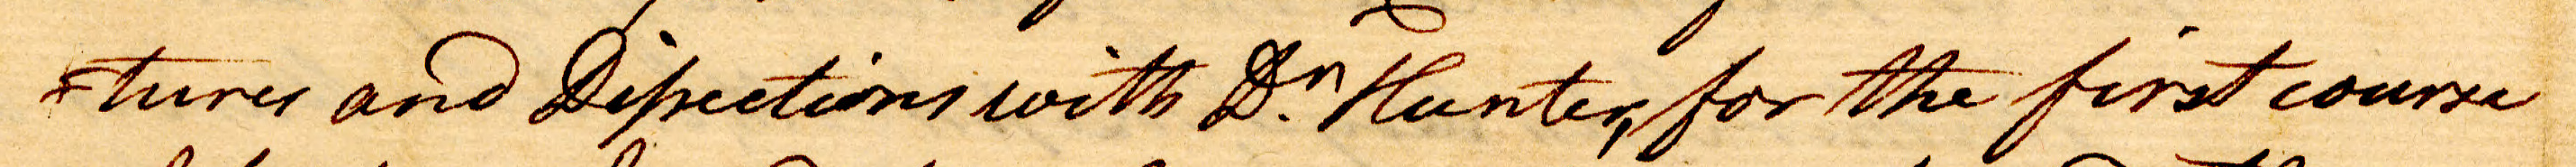-tures and Dissections with D^r. Hunter, for the first course
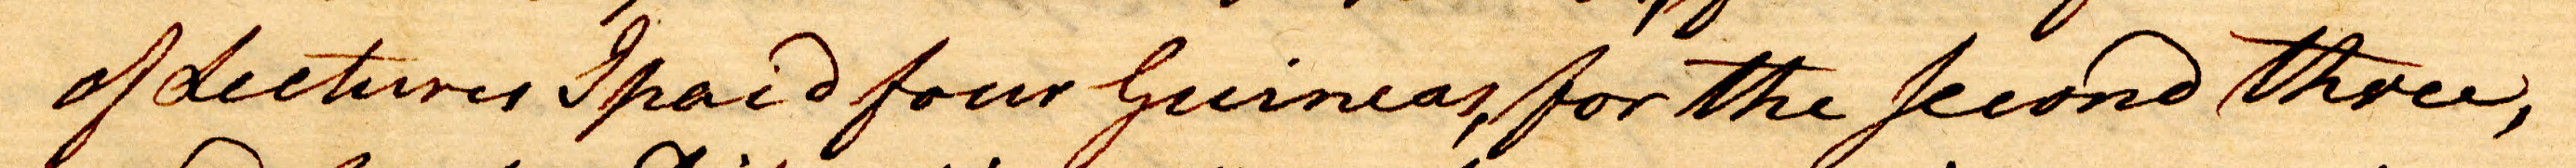of Lectures I paid four Guineas, for the second three,
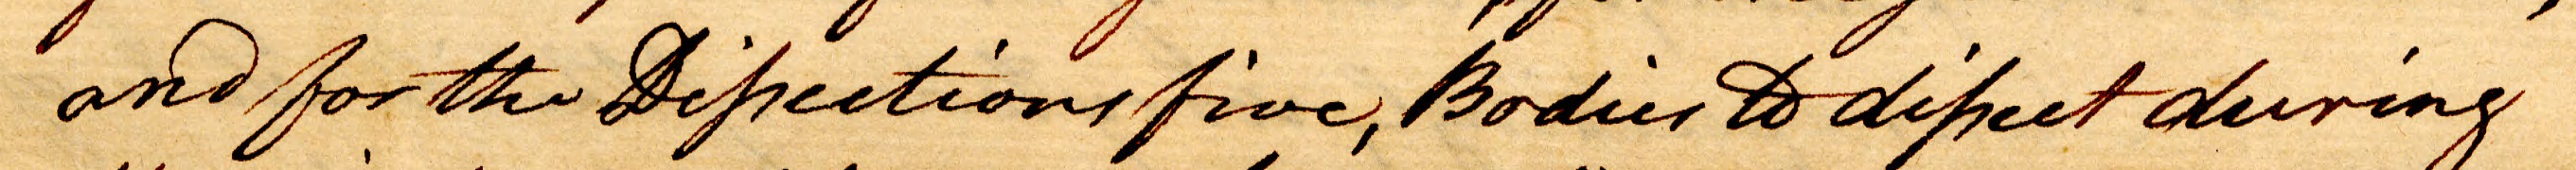and for the Dissections five, Bodies to dissect during
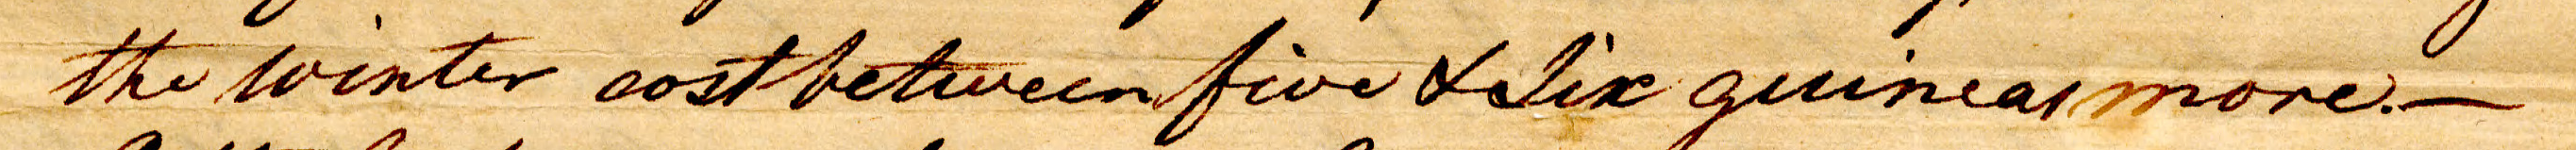the winter cost between five & six guineas more.-
